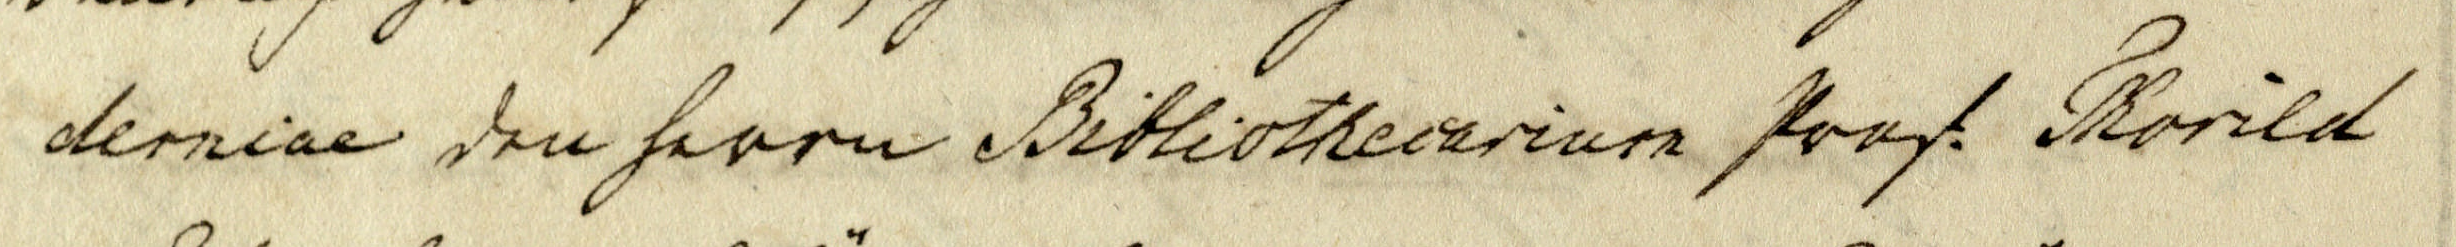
demiae den Herrn Bibliothecarium Prof. Thorild
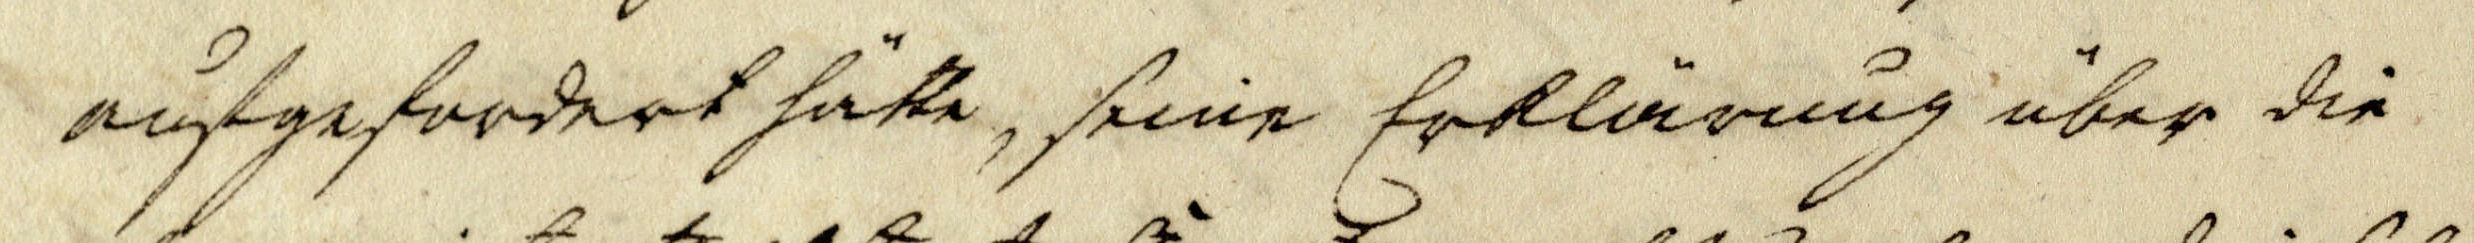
aufgefordert hätte, seine Erklärung über die
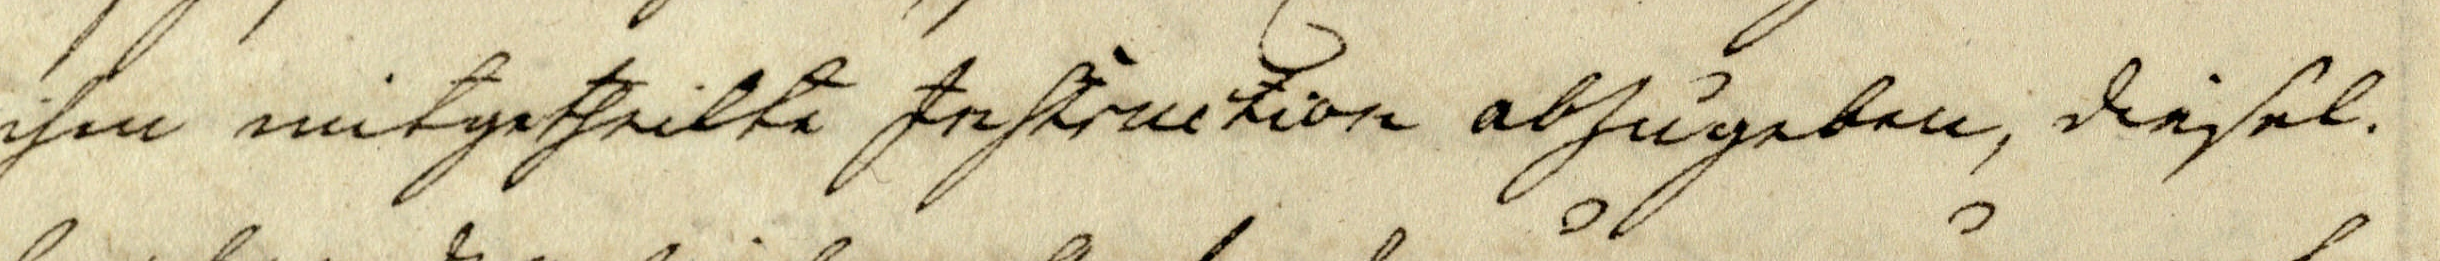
ihm mitgetheilte Instruction abzugeben, diesel¬
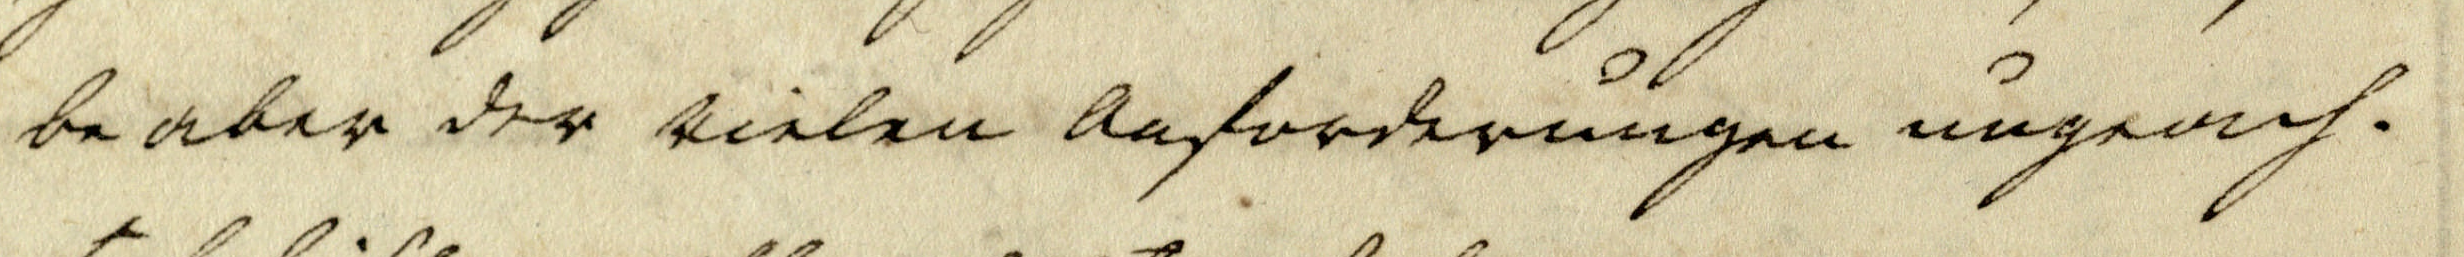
be aber der vielen Anforderungen ungeach¬
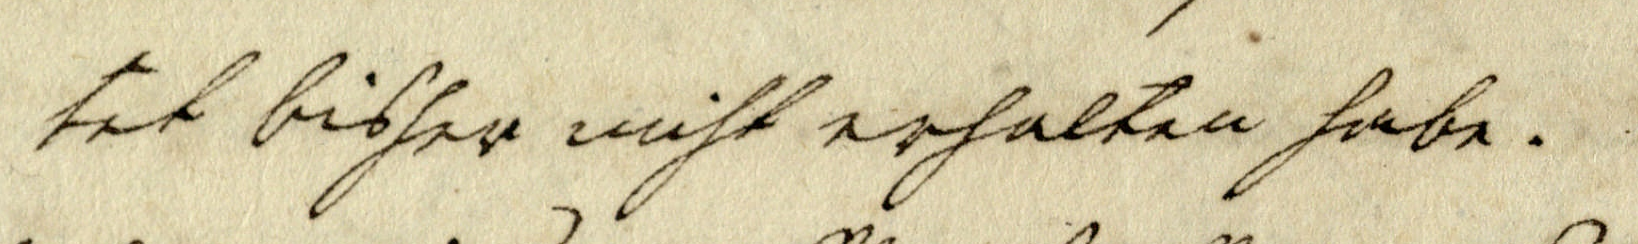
tet bisher nicht erhalten habe.
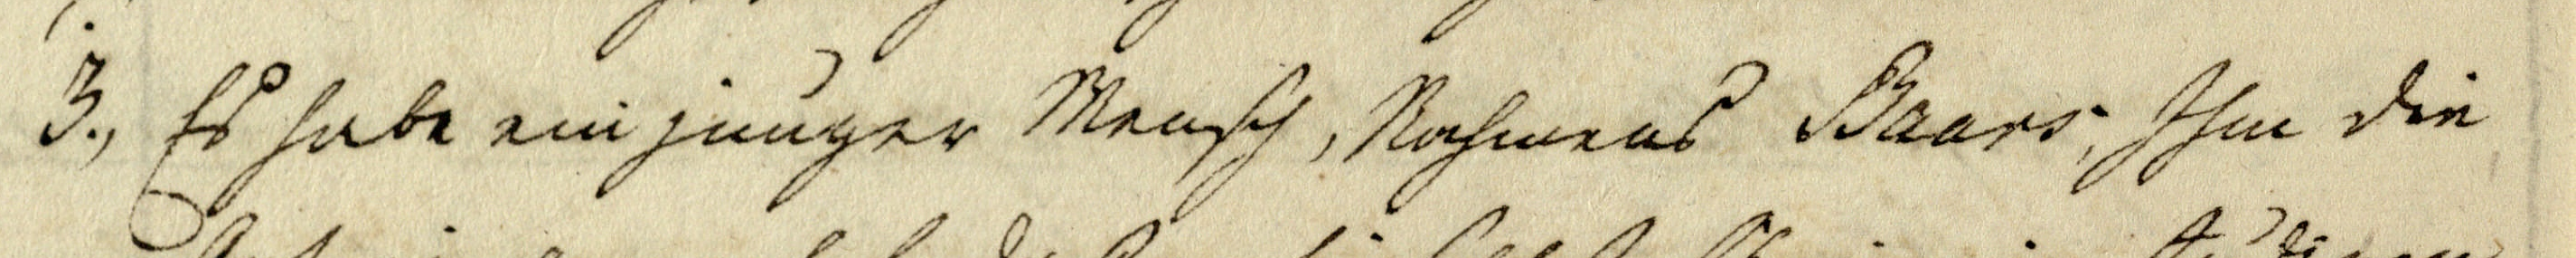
3., Es habe ein junger Mensch, Nahmens Baars Ihm die
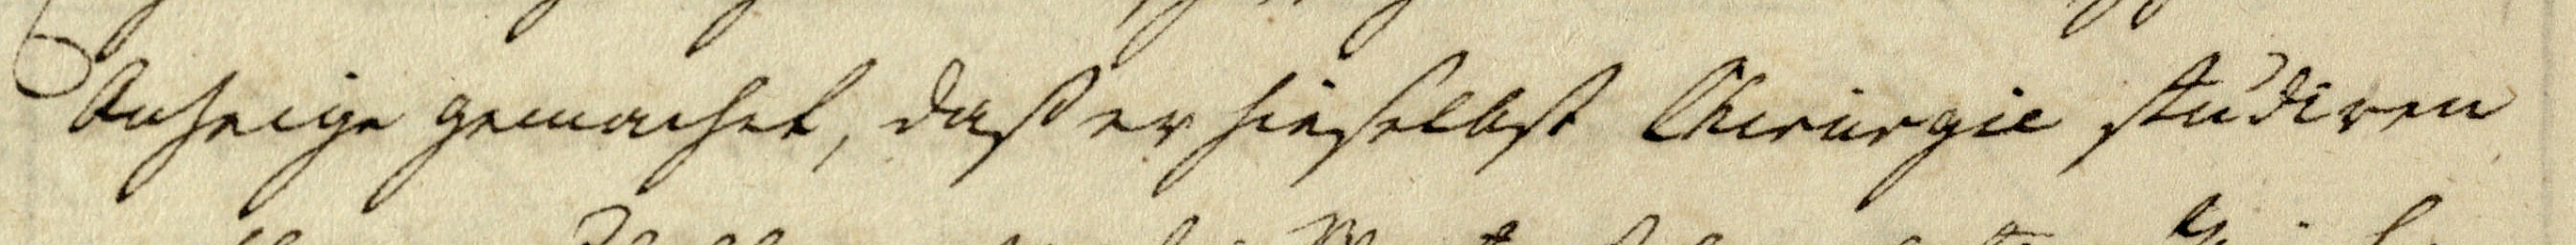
Anzeige gemachet, daß er hieselbst Chirurgie studiren
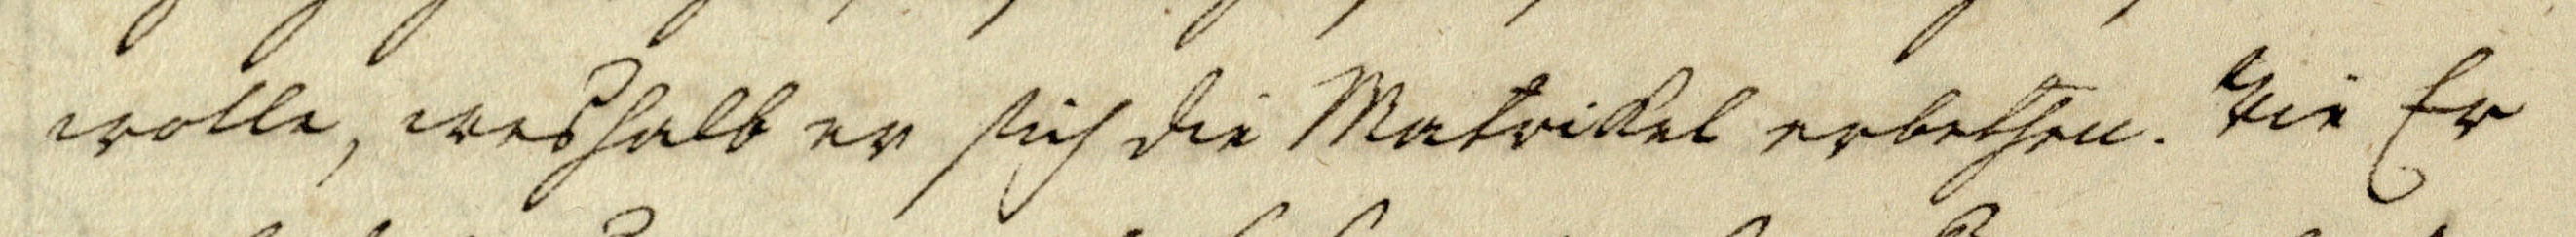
wolle, weshalb er sich die Matrikel erbethen. Wie Er
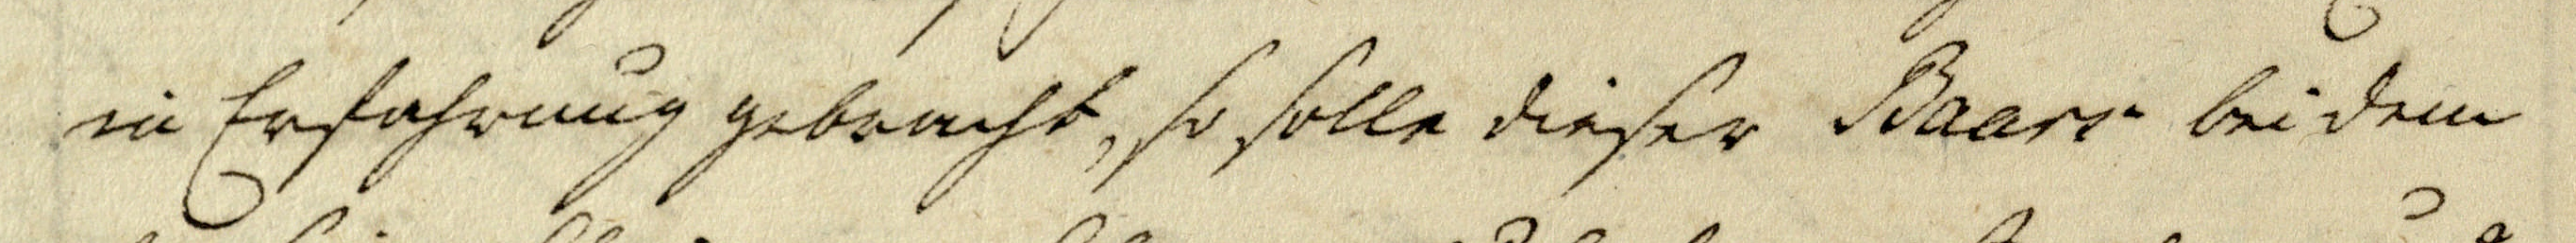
in Erfahrung gebracht, so solle dieser Baars bei dem
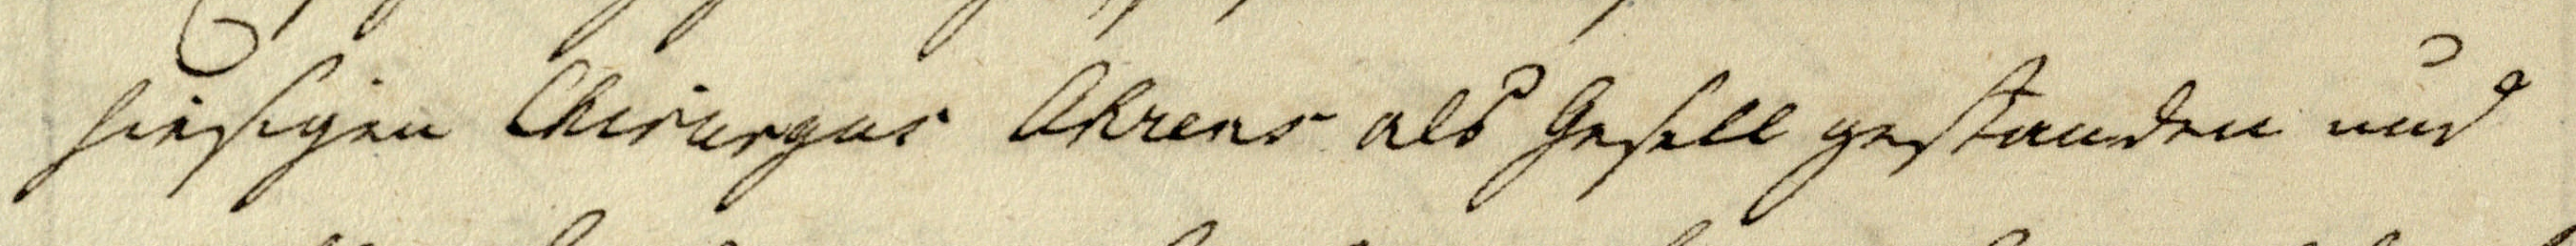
hiesigen Chirurgus Ahrens als Gesell gestanden und
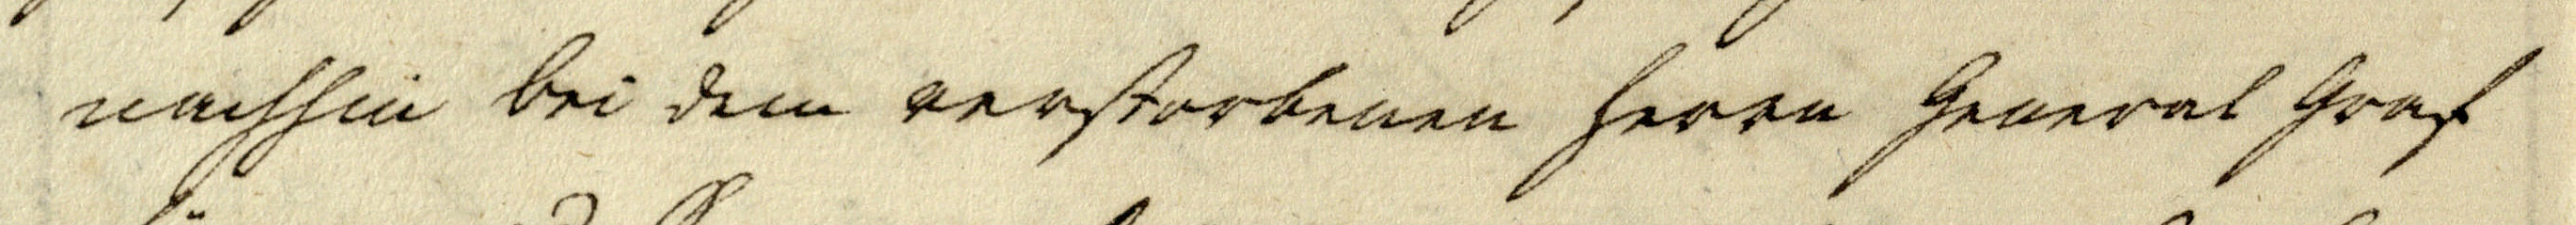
nachhin bei dem verstorbenen Herrn General Graf
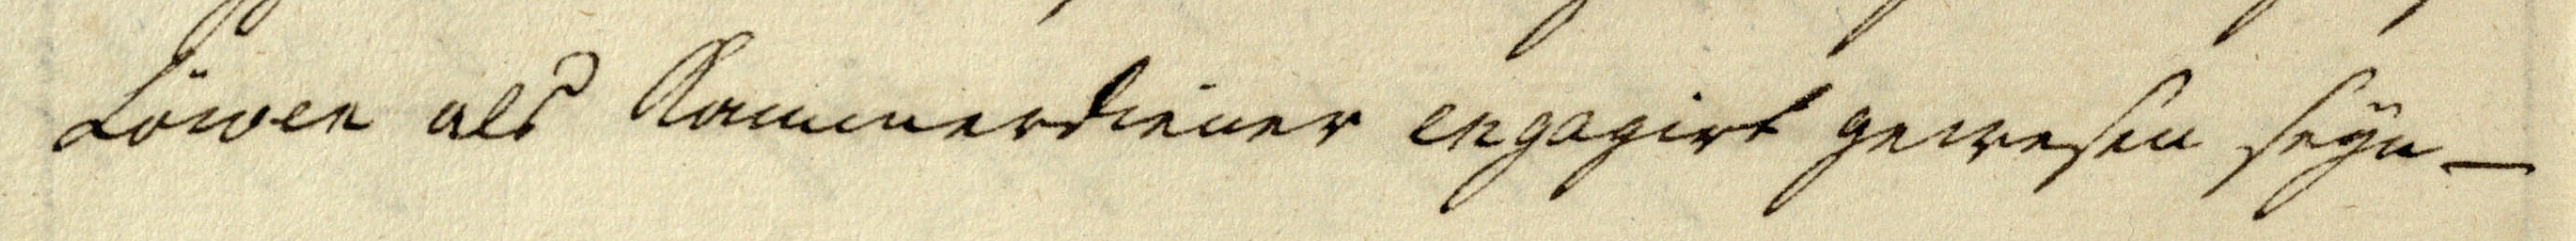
Löwen als Kammerdiener engagirt gewesen seÿn
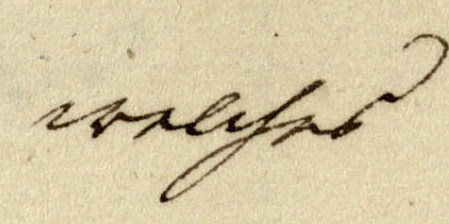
welches
